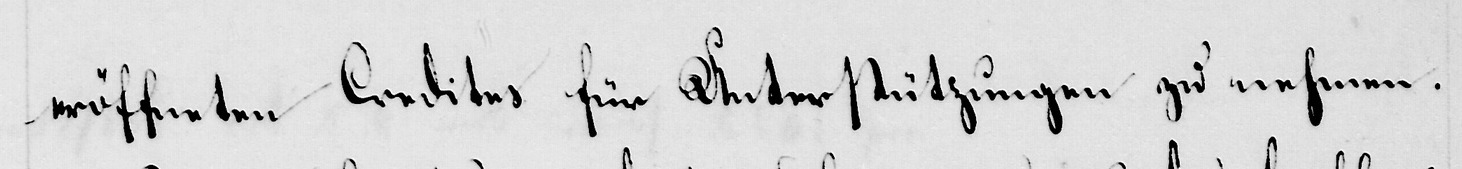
eröffneten Credites für Unterstützungen zu nehmen.
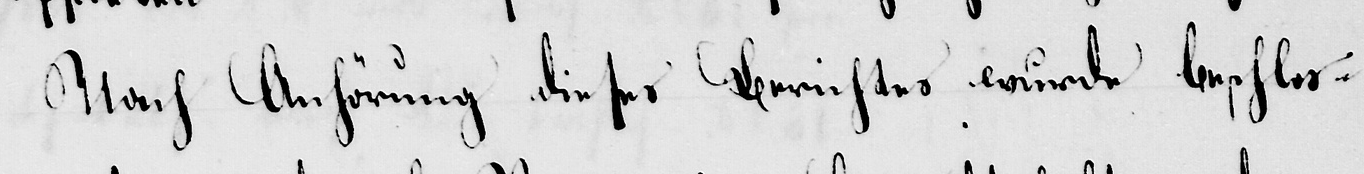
Nach Anhörung dieses Berichtes wurde beschlo¬
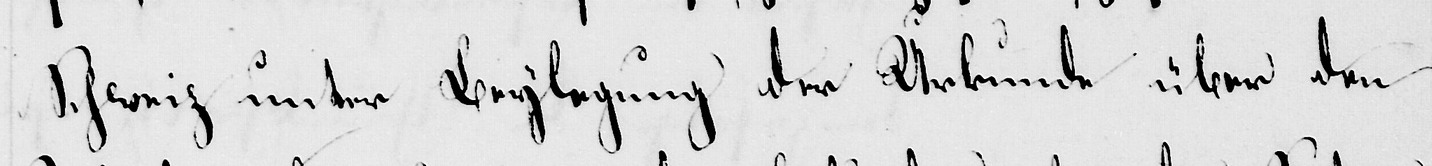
Schweiz unter Beylegung der Urkunde über den
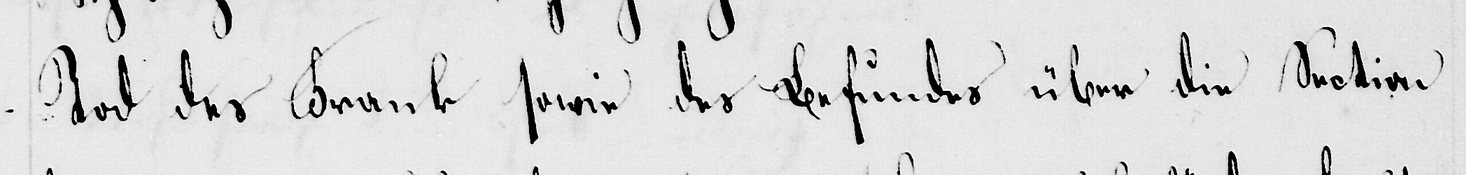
Tod des Frank sowie des Befundes über die Section
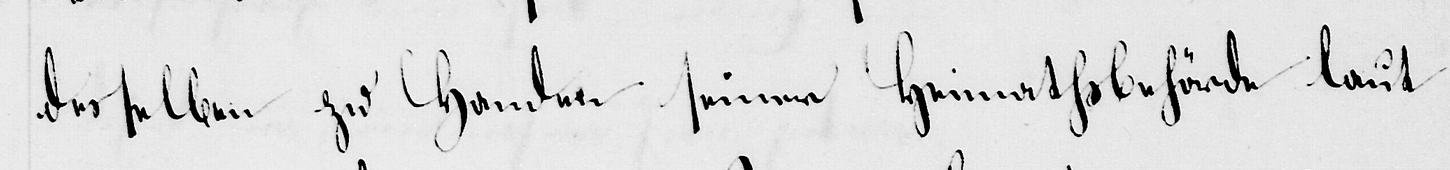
desselben zu Handen seiner Heimathsbehörde laut
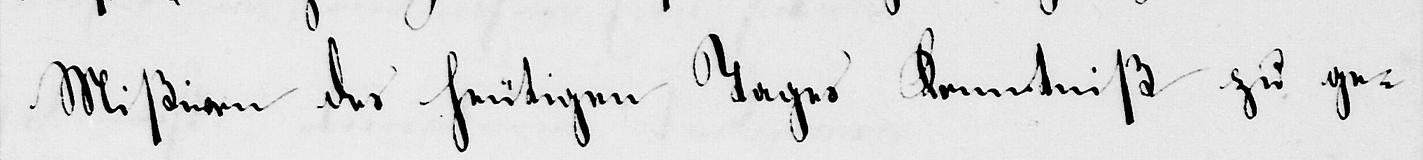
Mißiven des heutigen Tages Kenntniß zu ge¬
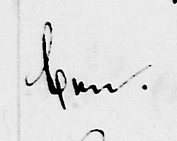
ben.
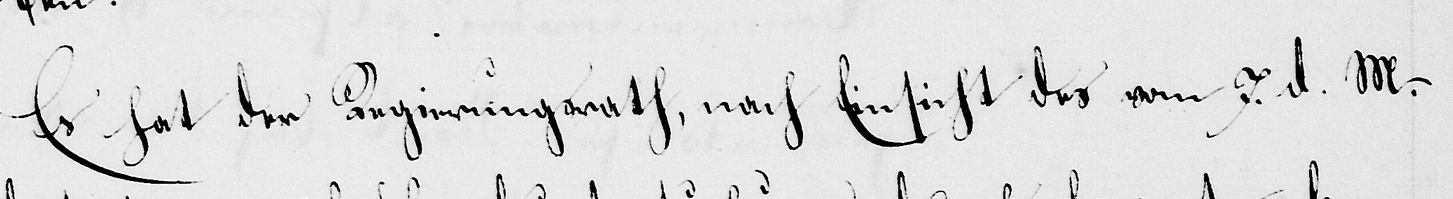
Es hat der Regierungsrath, nach Einsicht des vom 7. d. M.
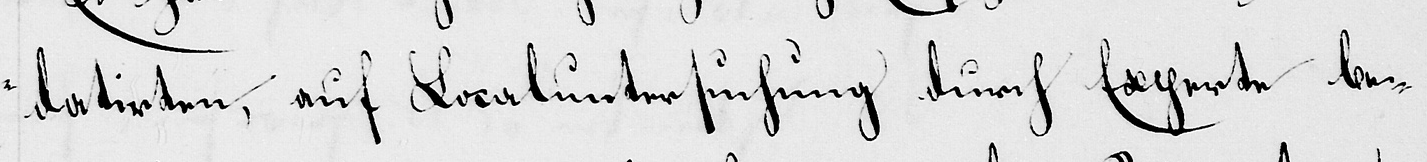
datirten, auf Localuntersuchung durch Experte be¬
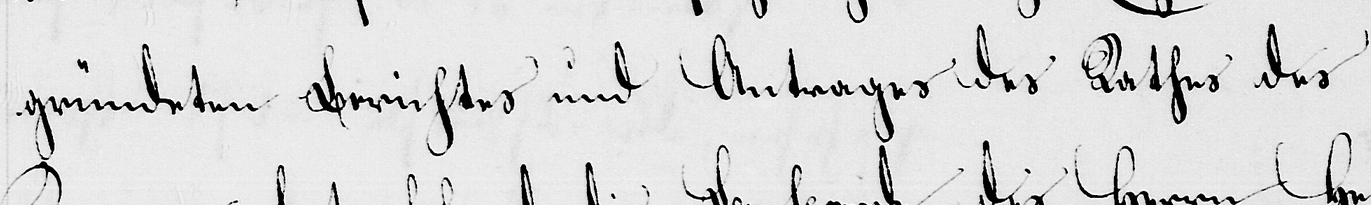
gründeten Berichtes und Antrages des Rathes des
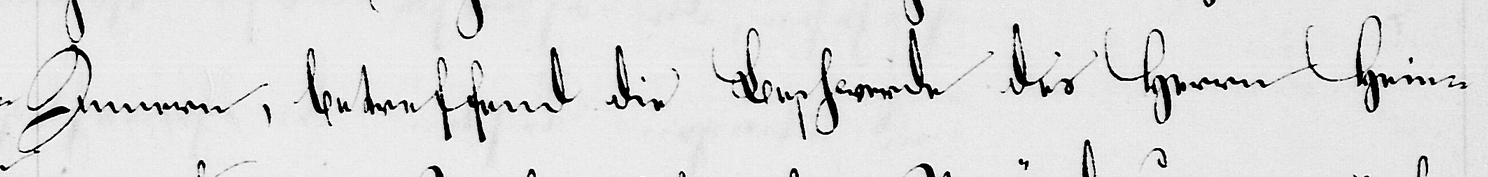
Innern, betreffend die Beschwerde des Herrn Hein¬
